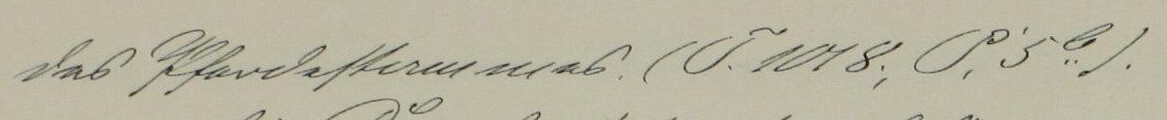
des Pferdestammes. (T.1018; P.5b).
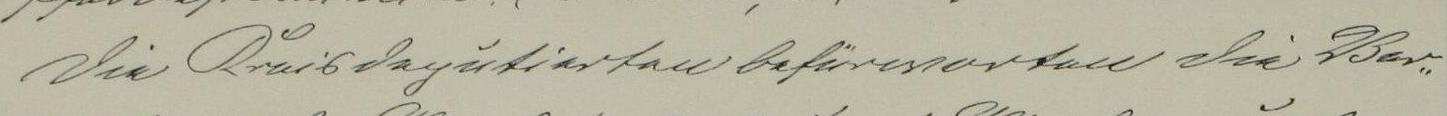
Die Kreisdeputierten befürworten die Ver-
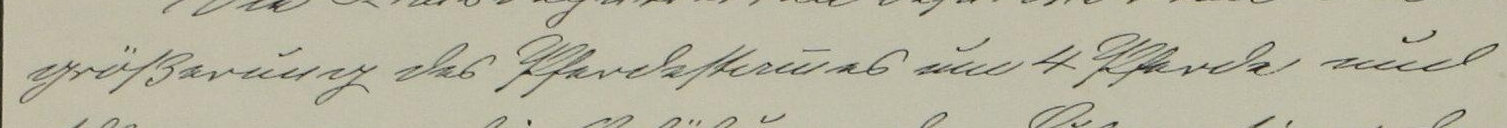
größerung des Pferdestammes um 4 Pferde und
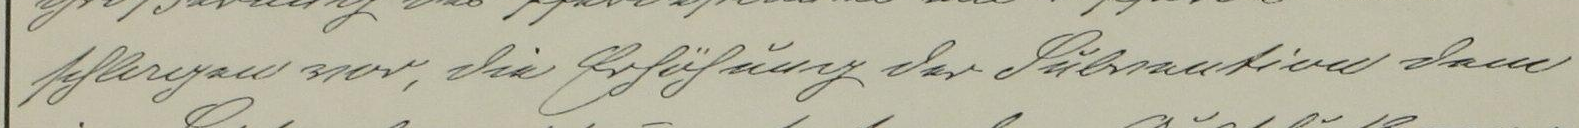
schlagen vor, die Erhöhung der Subvention dem
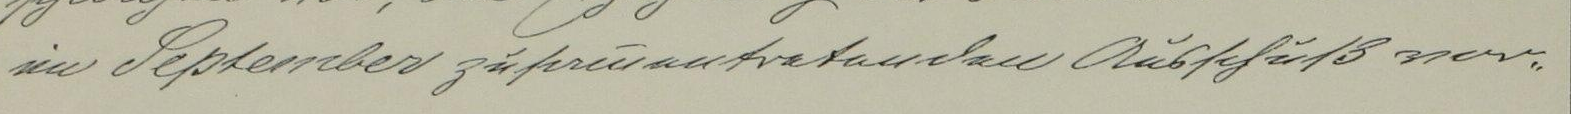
im September zusammentretenden Ausschuß vor-
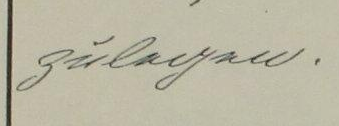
zulegen.
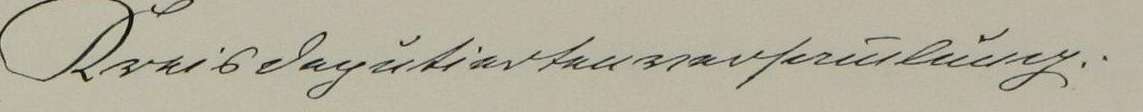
Kreisdeputiertenversammlung.
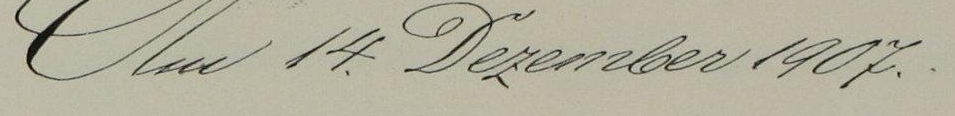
Am 14. Dezember 1907.
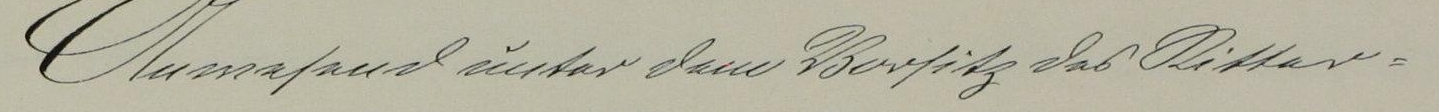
Anwesend unter dem Vorsitz des Ritter-
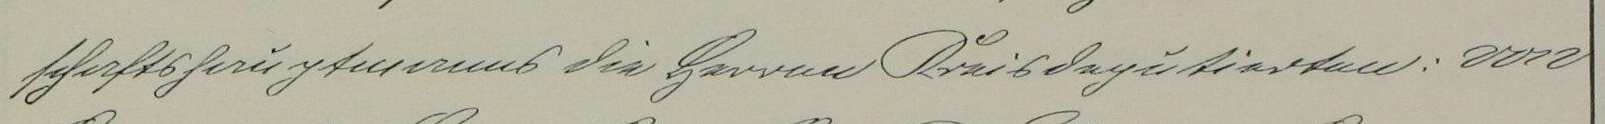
schaftshauptmanns die Herren Kreisdeputierten: von
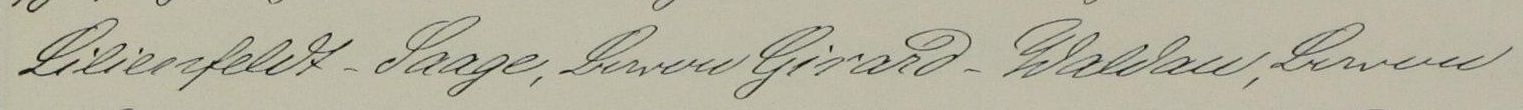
Lilienfeldt-Saage, Baron Girard-Waldau, Baron
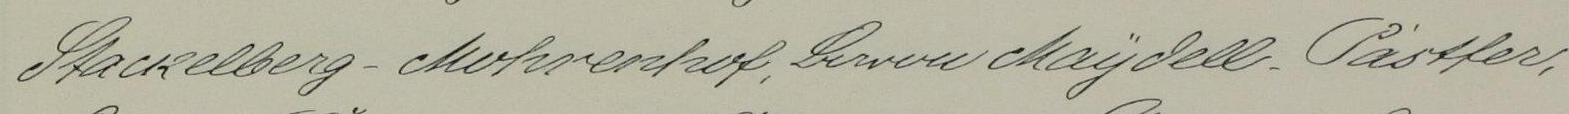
Stackelberg-Mohrenhof, Baron Maydell-Pastfer,
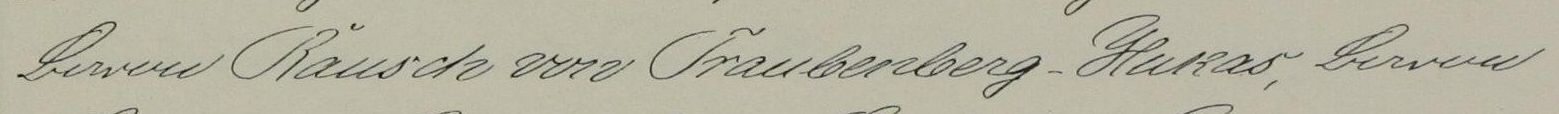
Baron Rausch von Traubenberg-Hukas, Baron
